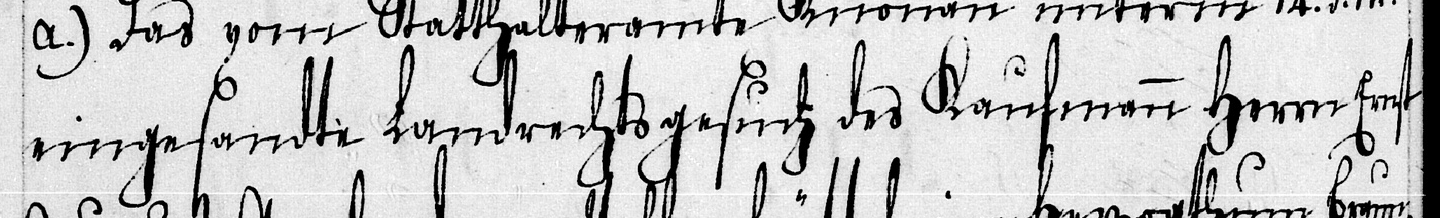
eingesandte Landrechtsgesuch des Kaufmann Herrn Er¬
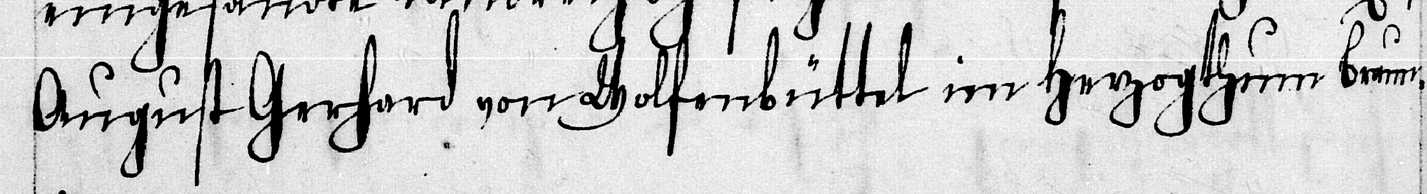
August Gerhard von Wolfenbüttel im Herzogthum Braun¬
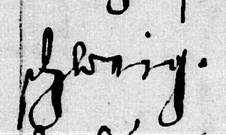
schweig.
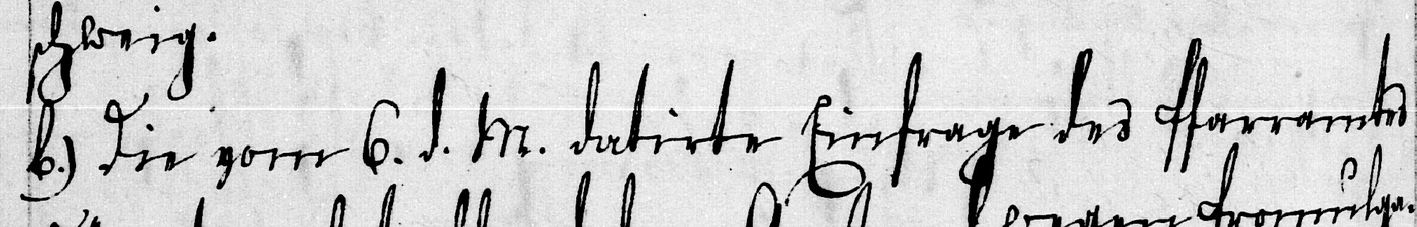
b.) Die vom 6. d. M. datirte Einfrage des Pfarramtes
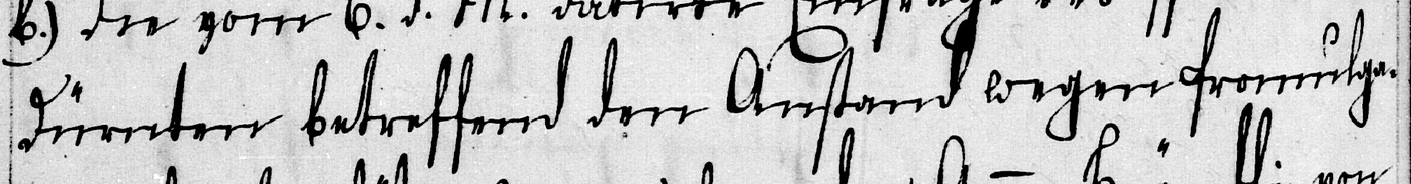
Dürnten betreffend den Anstand wegen Promulga¬
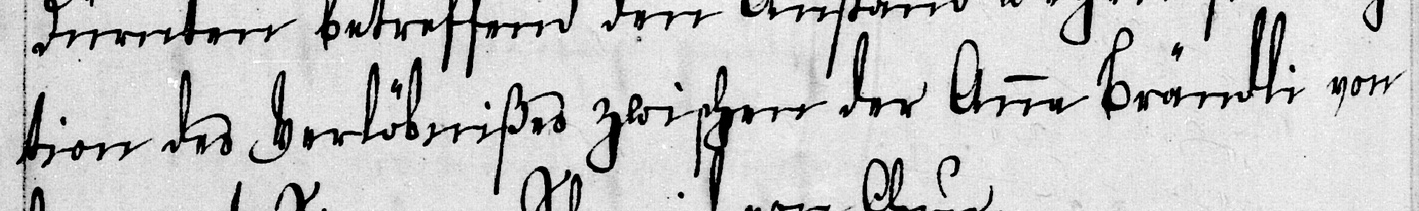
tion des Verlöbnißes zwischen der Anna Brändli von
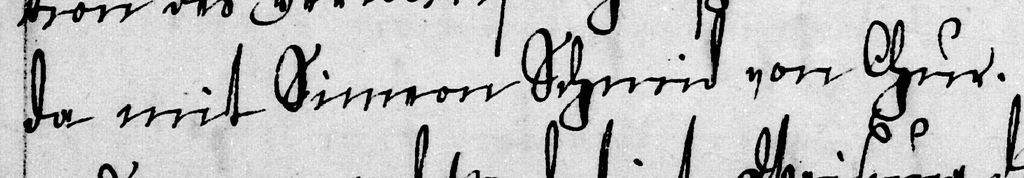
da mit Simon Schmid von Chur.
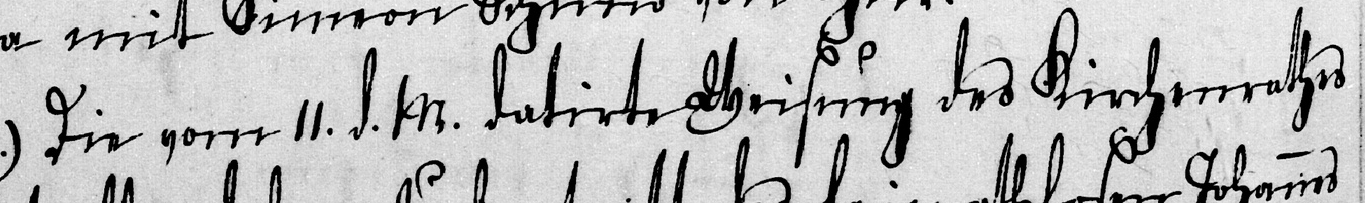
Die vom 11. d. M. datirte Weisung des Kirchenrathes
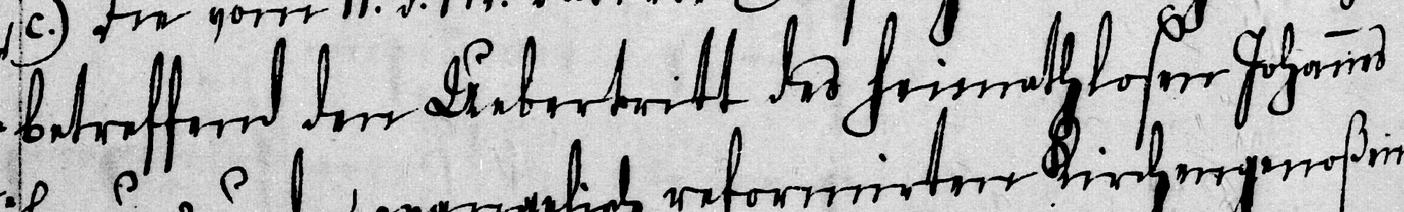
betreffend den Uebertritt des heimathlosen Johan¬
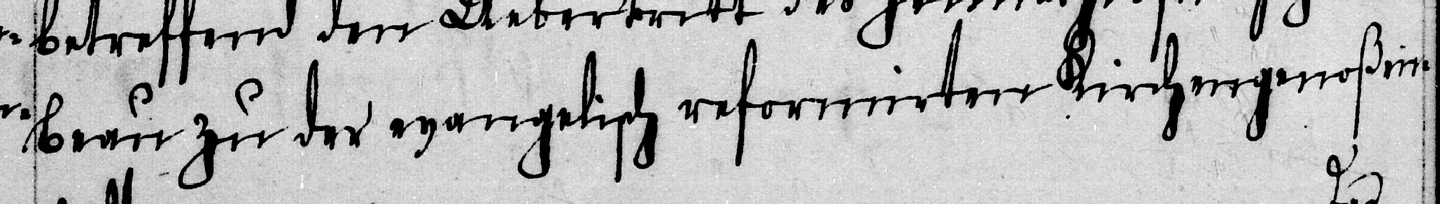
Beau zu der evangelisch reformirten Kirchengenoßen¬
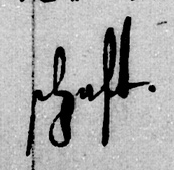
scha¬
